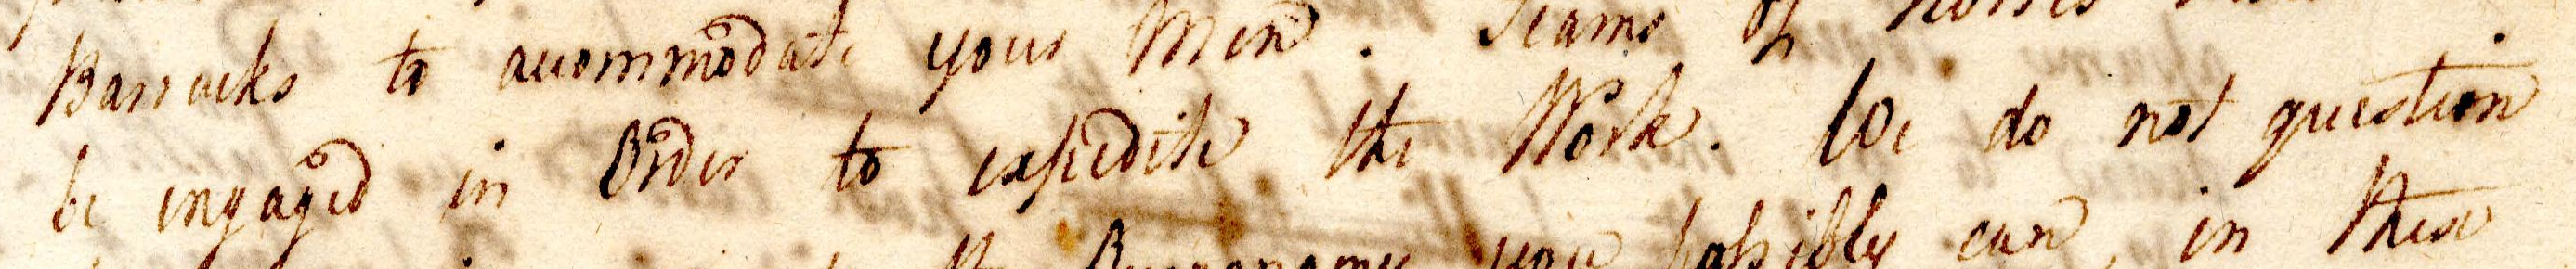be engaged in Order to expedite the Work. We do not question
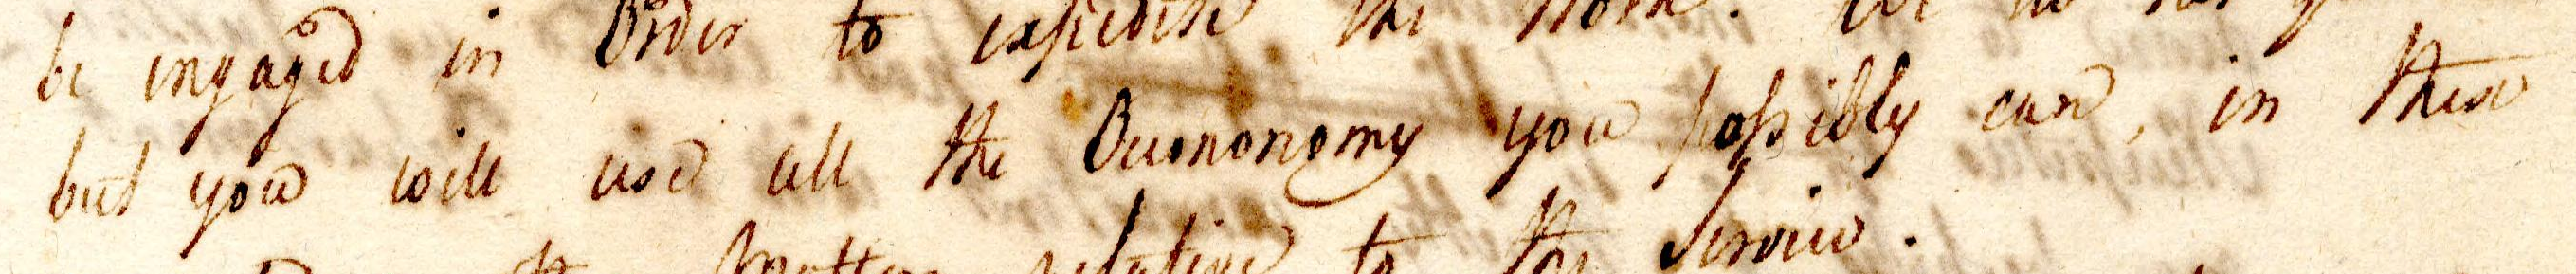but you will use all the Oeconomy you possibly can in these
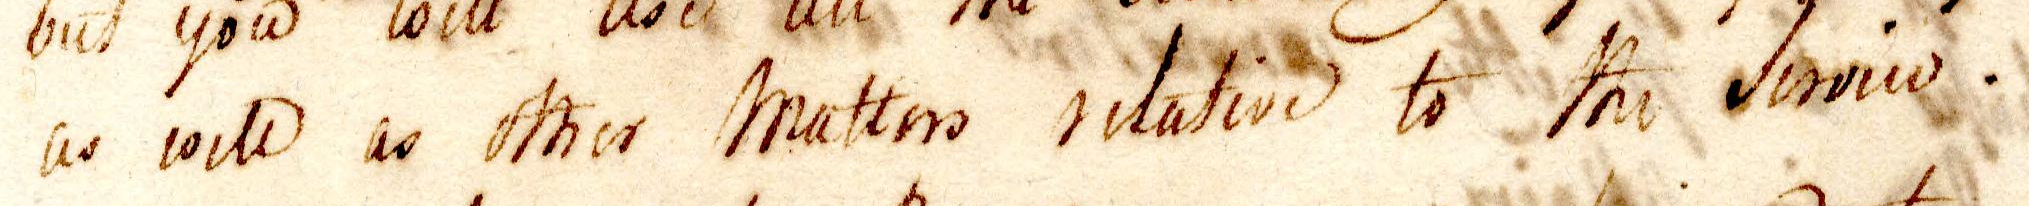as well as other Matters relative to the Service.
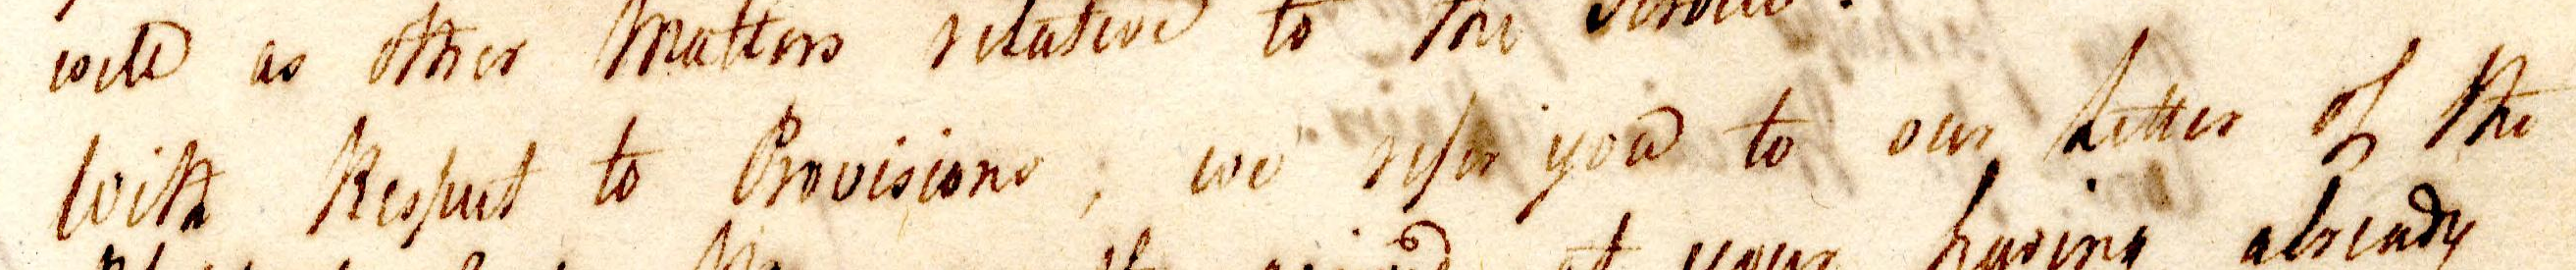With Respect to Provisions, we refer you to our Letter of the
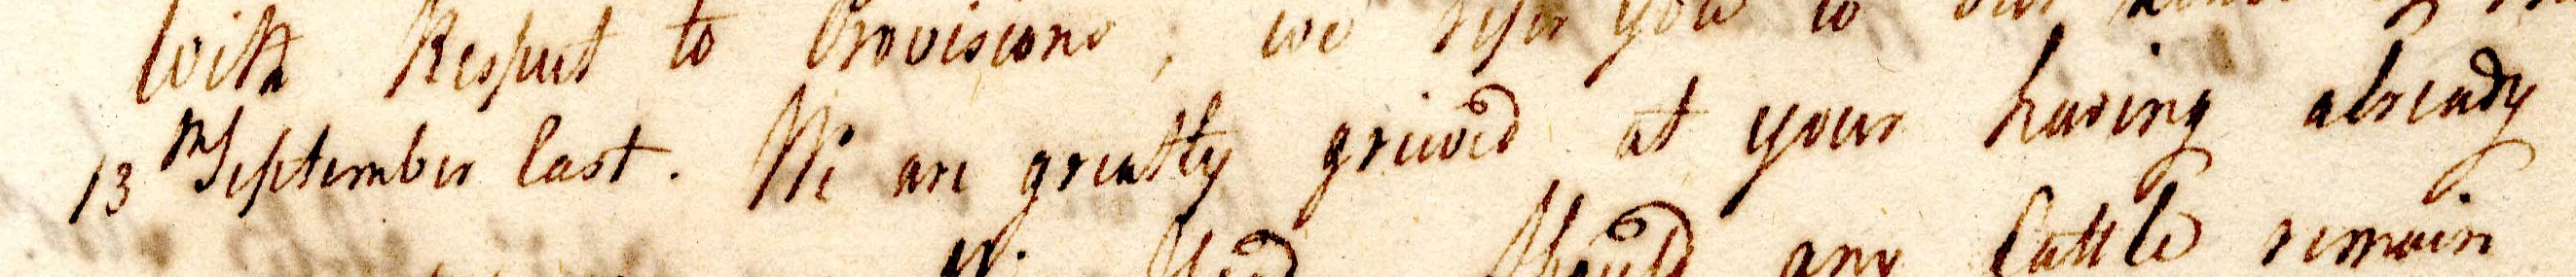13^th September last. We are greatly grieved at your having already
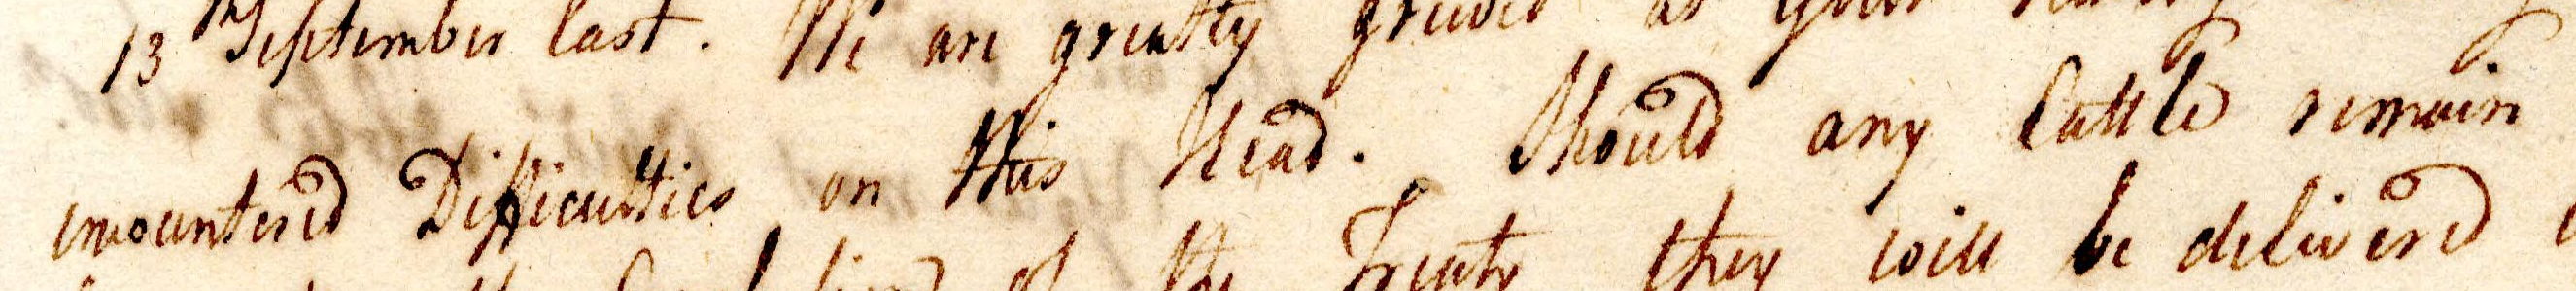encountered Difficulties on this Head. Should any Cattle remain
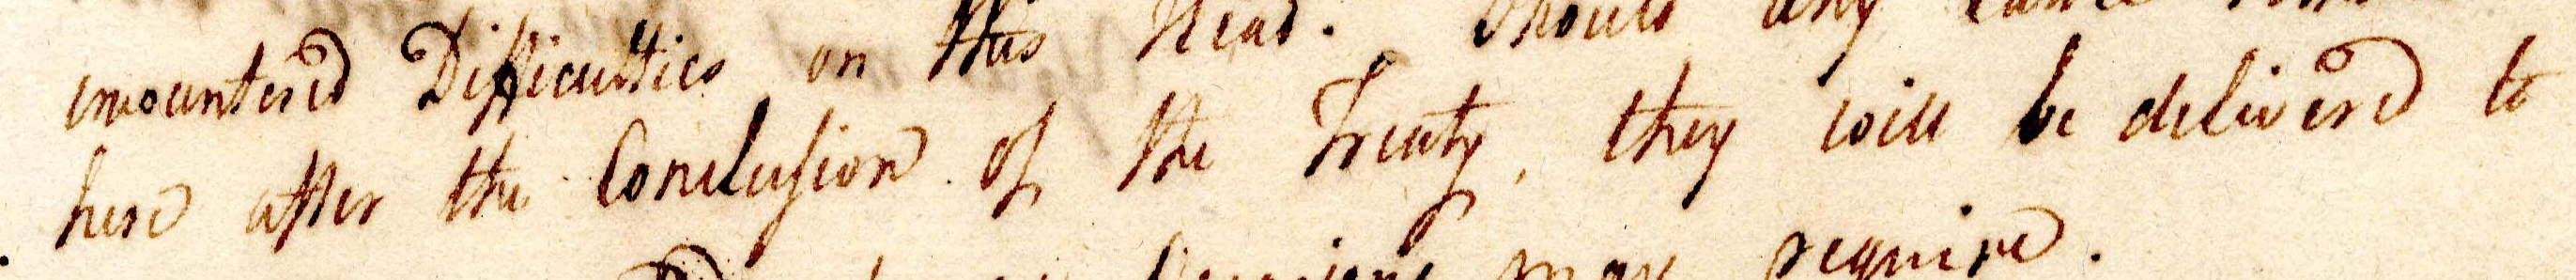here after the Conclusion of the Treaty, they will be delivered to
